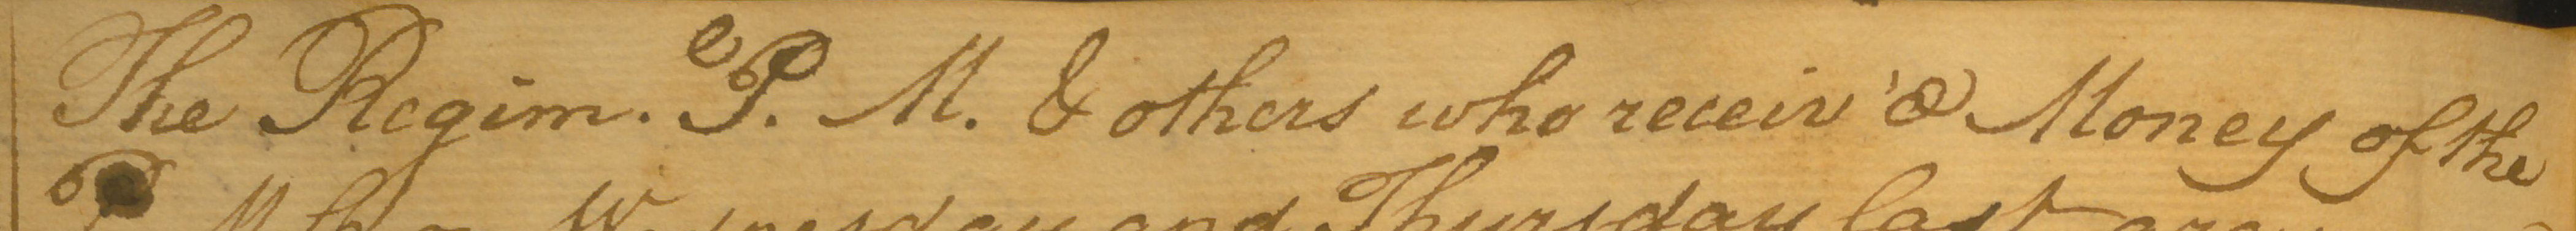The Regim^l. P. M. & others who receiv'd Money of the
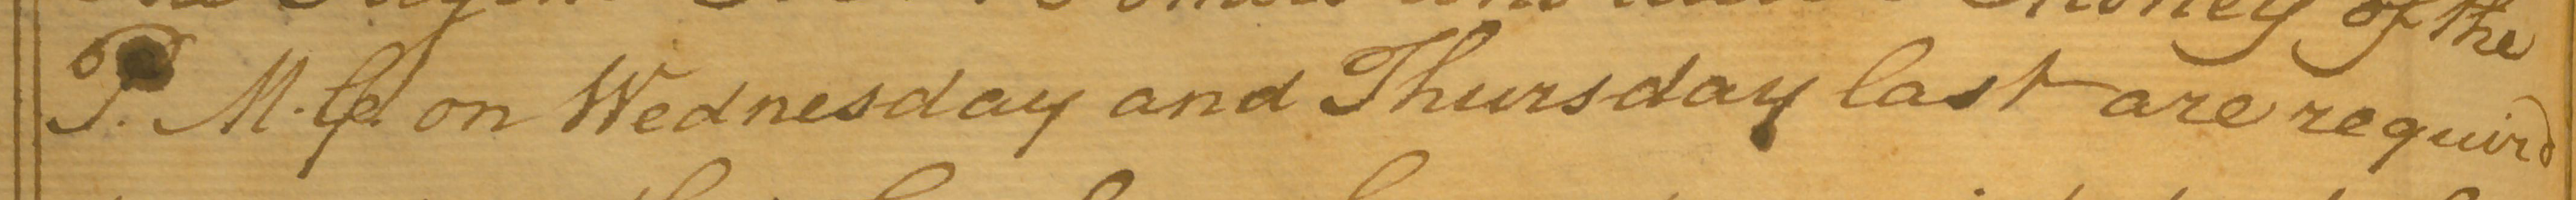P. M. G. on Wednesday and Thursday last are requird
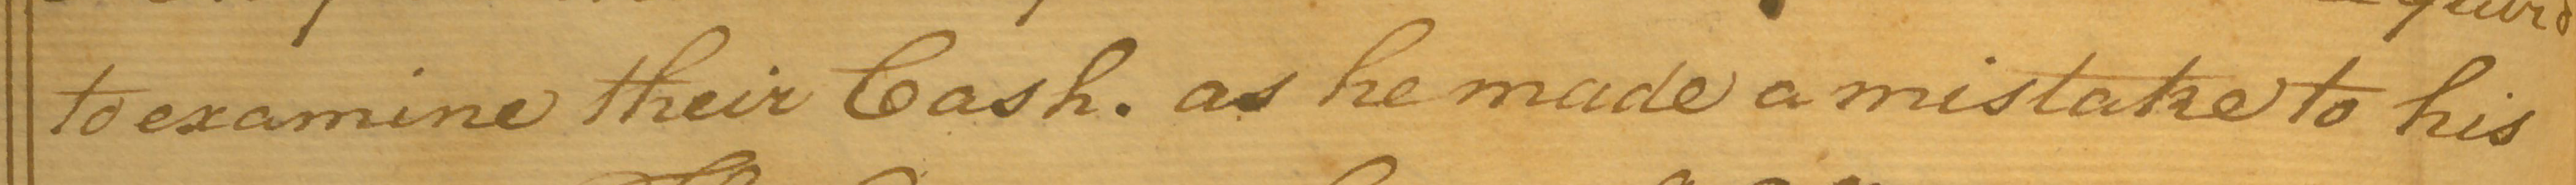to examine their Cash. as he made a mistake to his
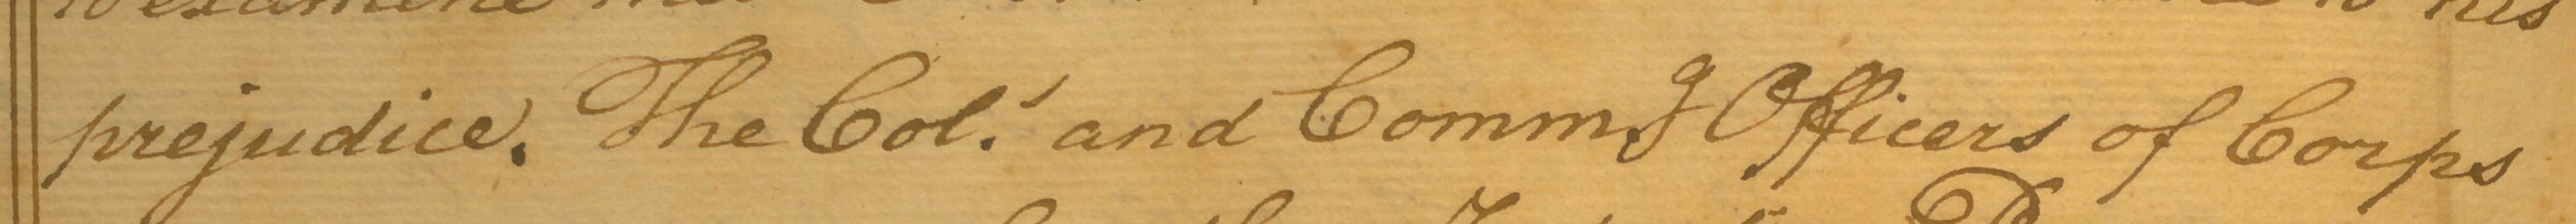prejudice. The Col^s. and Comm^g. Officers of Corps
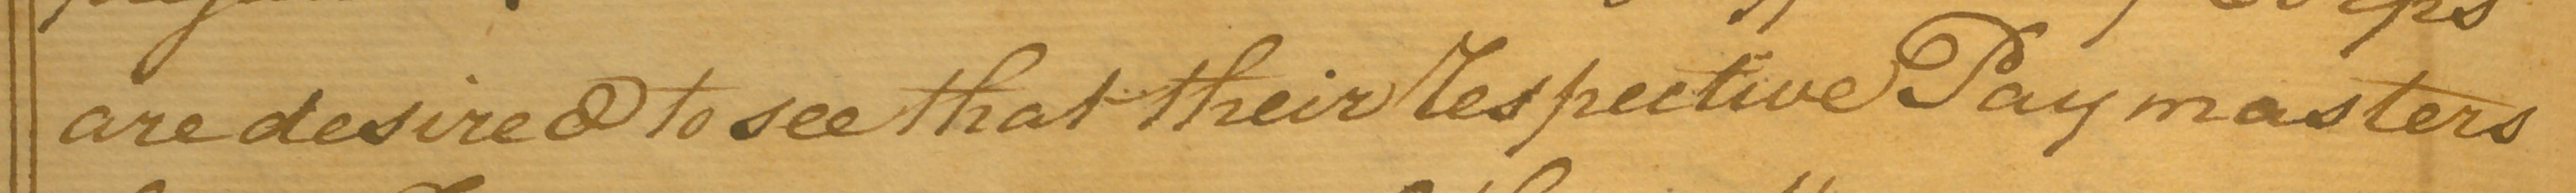are desired to see that their respective Paymasters
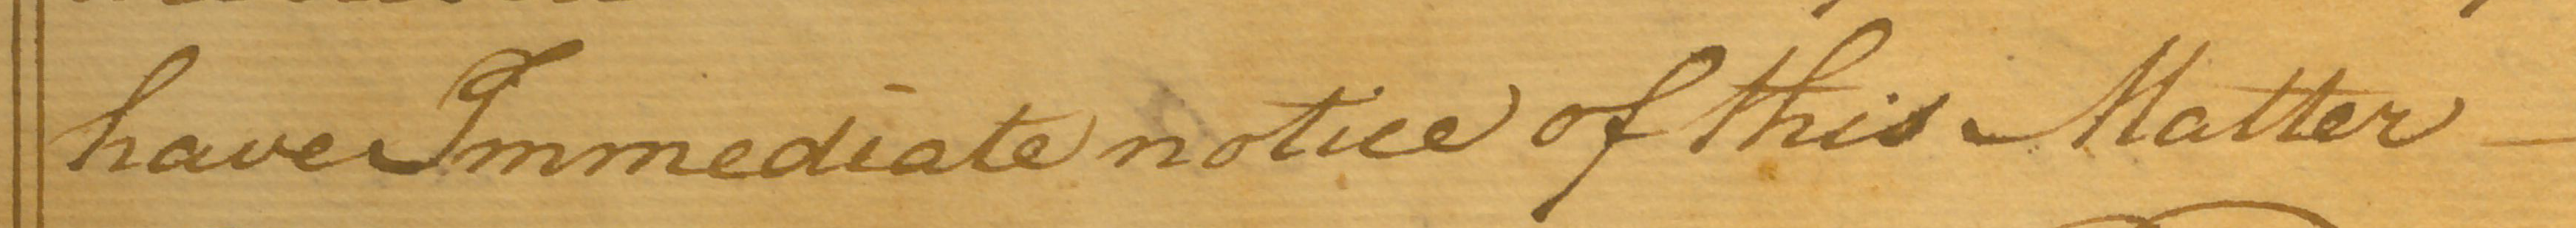have Immediate notice of this Matter-
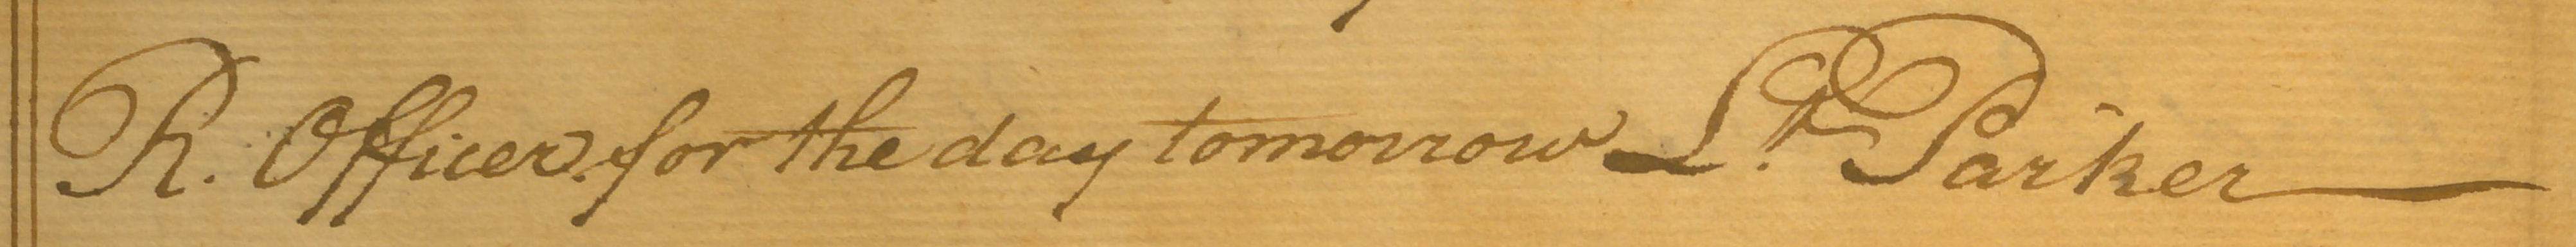R. Officer for the day tomorrow L^t. Parker-
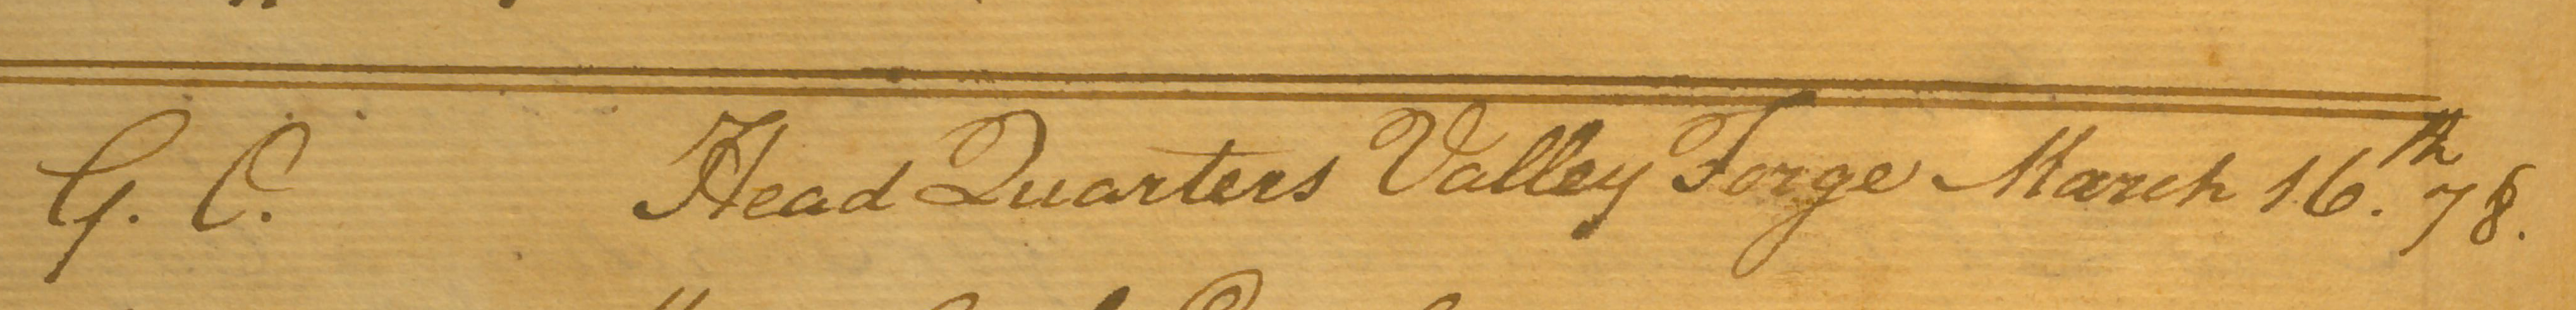G. O. Head Quarters Valley Forge March 16^th. 78
